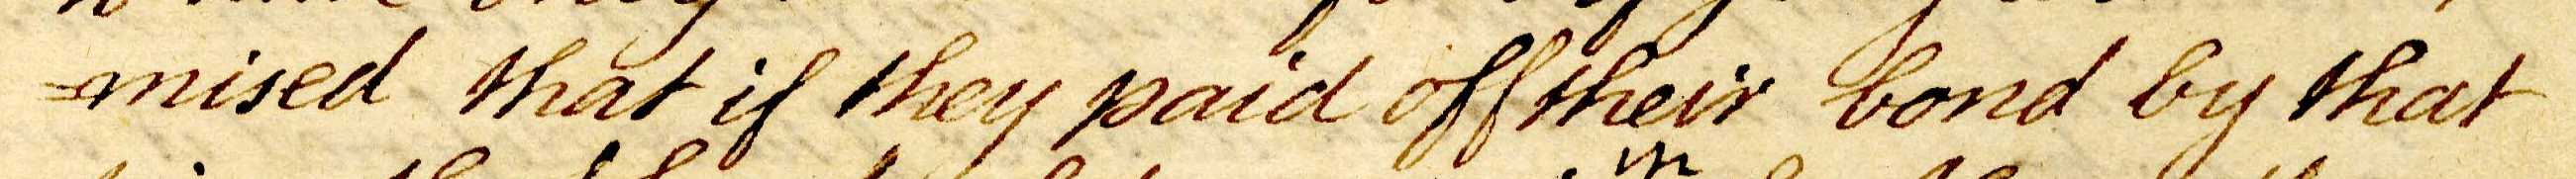-mised that if they paid off their bond by that
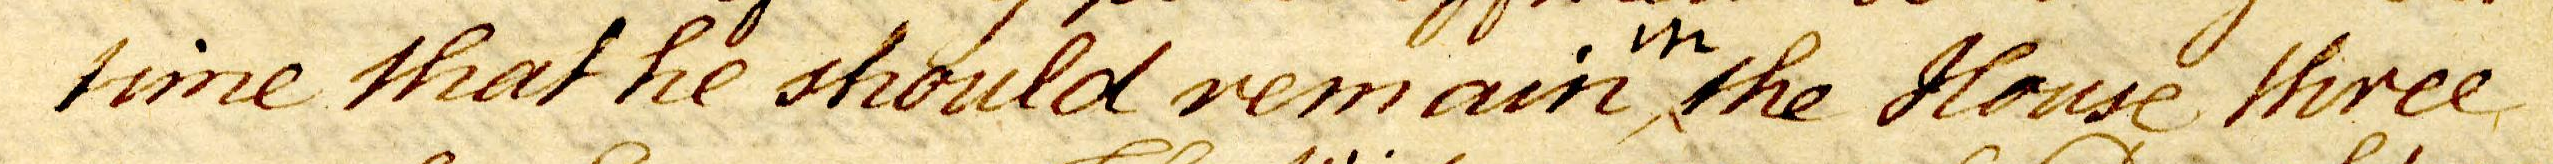time that he should remain ^ the House three
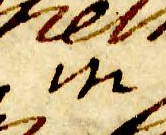in
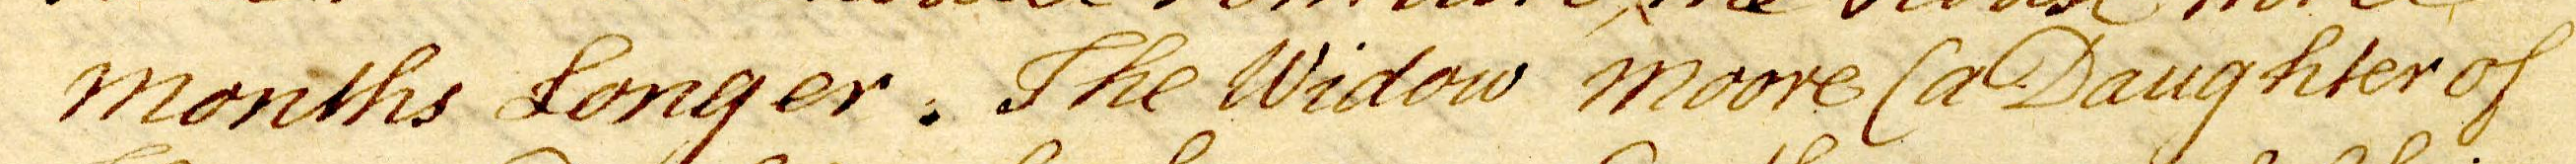Months Longer. The Widow Moore (a Daughter of
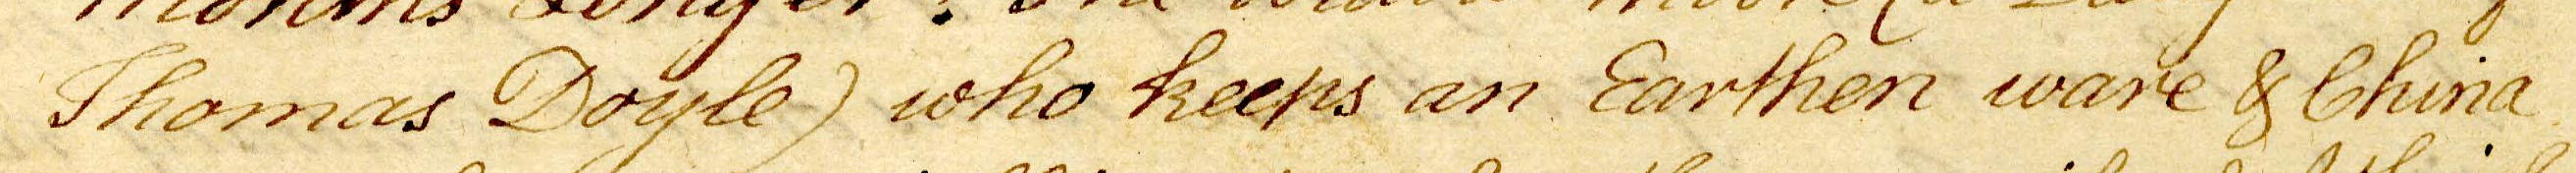Thomas Doyle) who keeps an Earthen ware & China
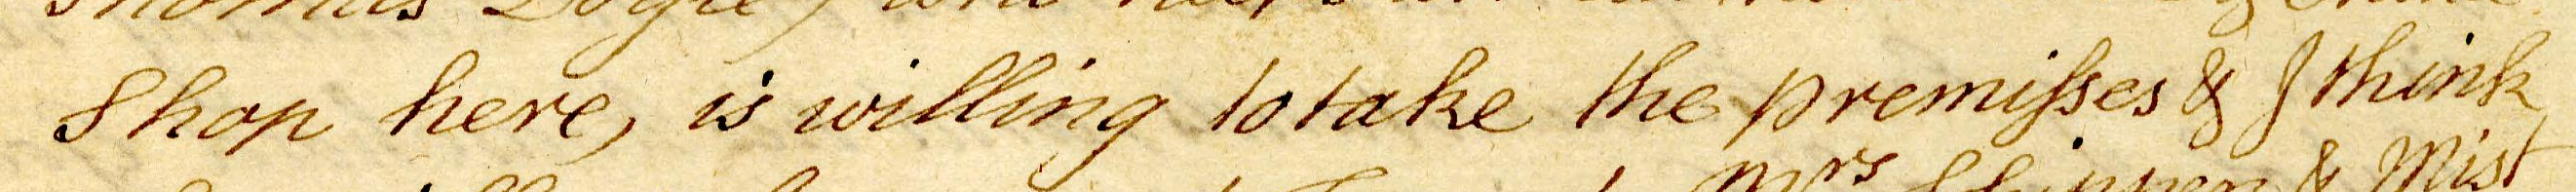Shop here, is willing to take the premisses & I think
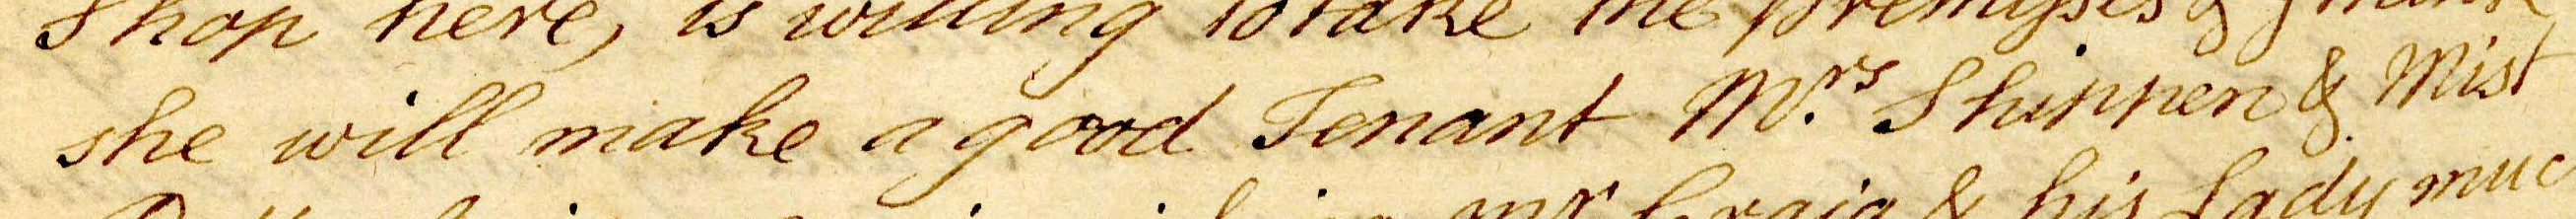she will make a good Tenant M.^rs Shippen & Mist
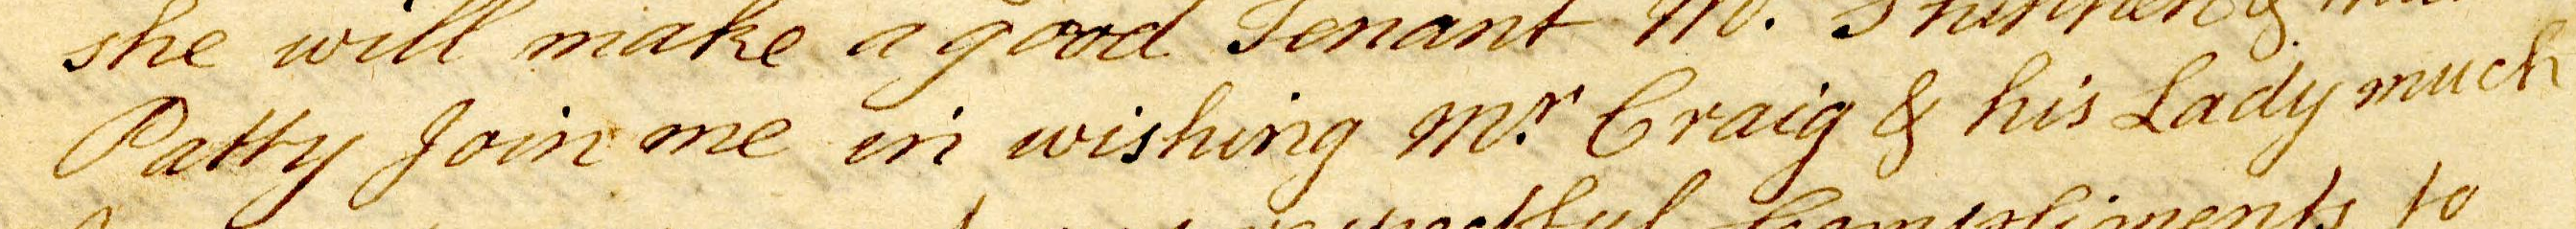Patty Join me in wishing M.^r Craig & his Lady much
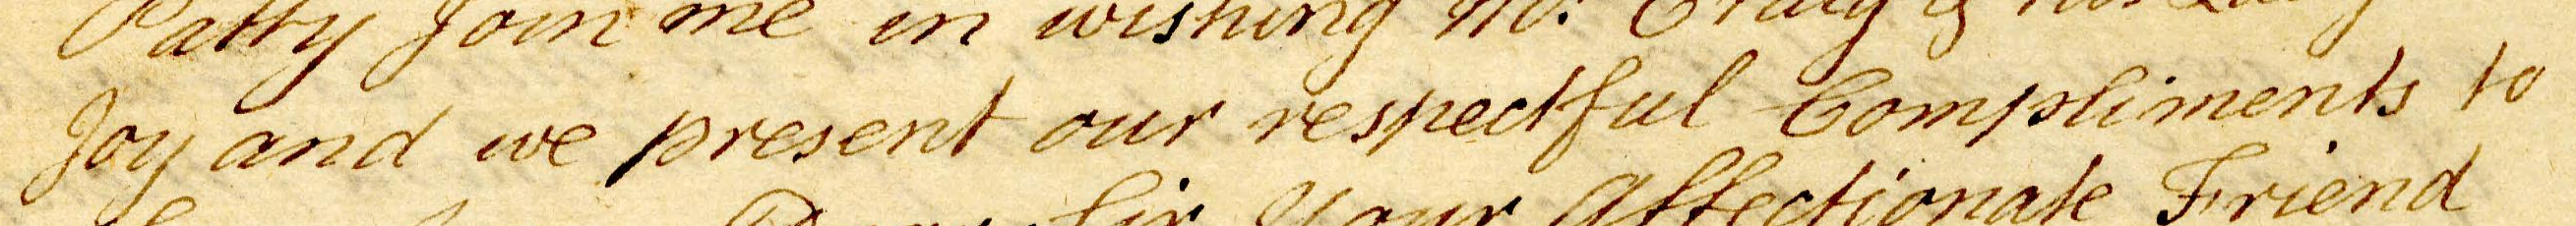Joy and we present our respectful Compliments to
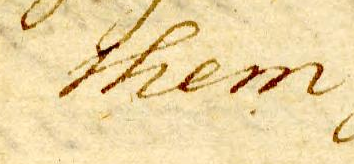them
